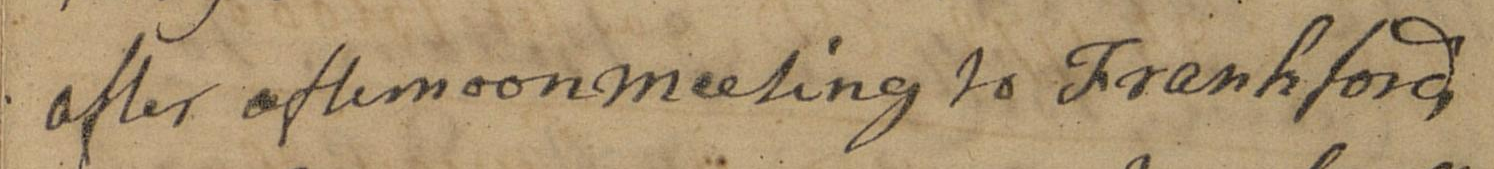after afternoon meeting to Frankford,
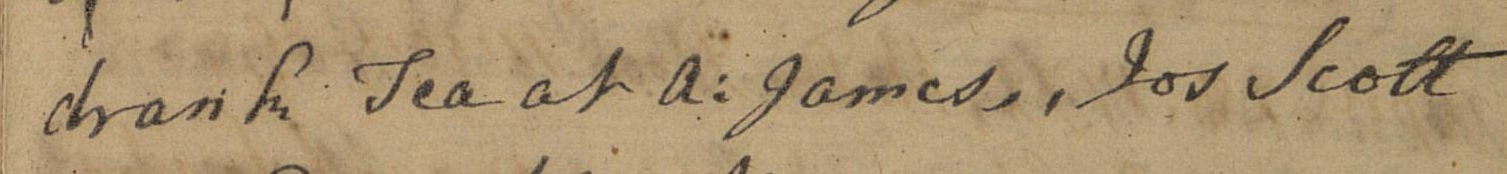drank Tea at A: James,, Jos Scott
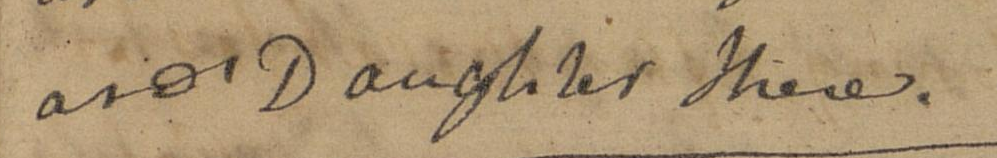and Daughter there.
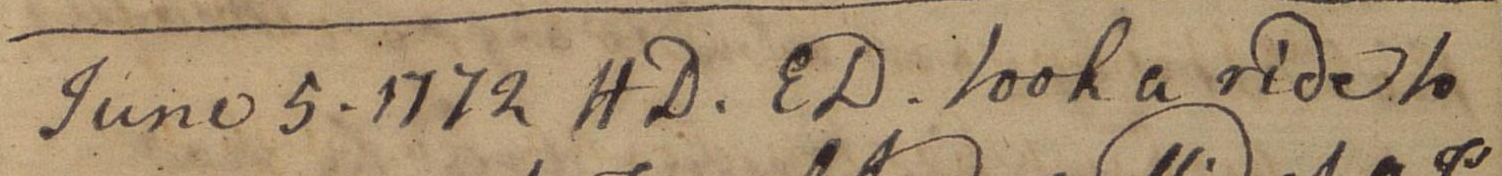June 5. 1772 HD. ED. took a ride to
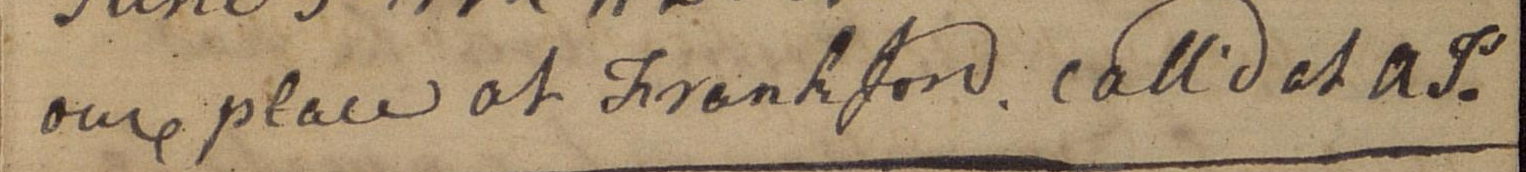our place at Frankford, call'd at AS.
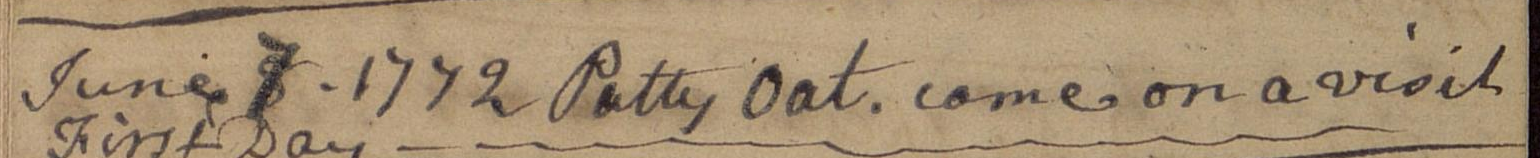June 7 - 1772 Patty Oat come on a visit
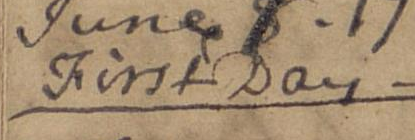First Day
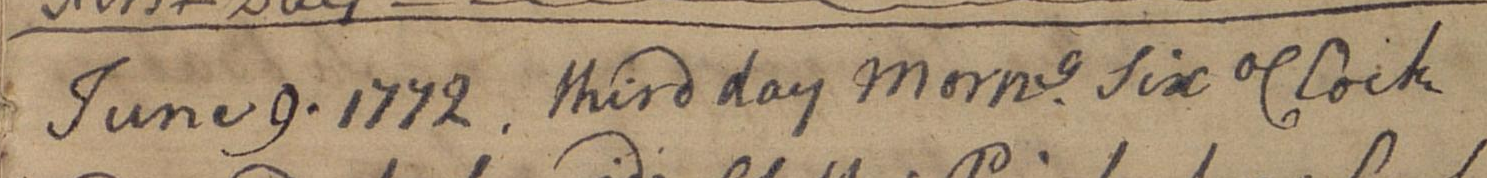June 9. 1772 third day Morn^g. six oClock
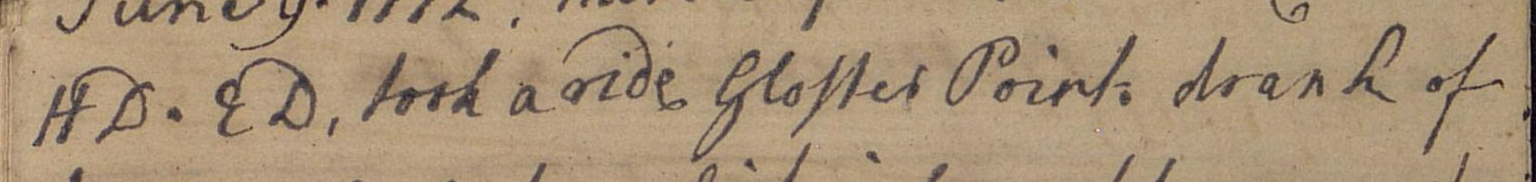HD. ED, took a ride Gloster Point. drank of
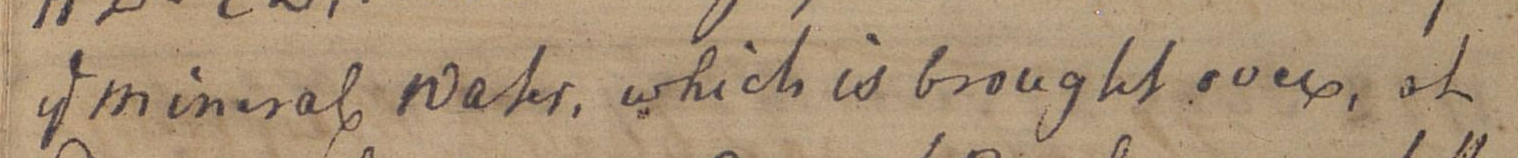y^e mineral water, which is brought over, at
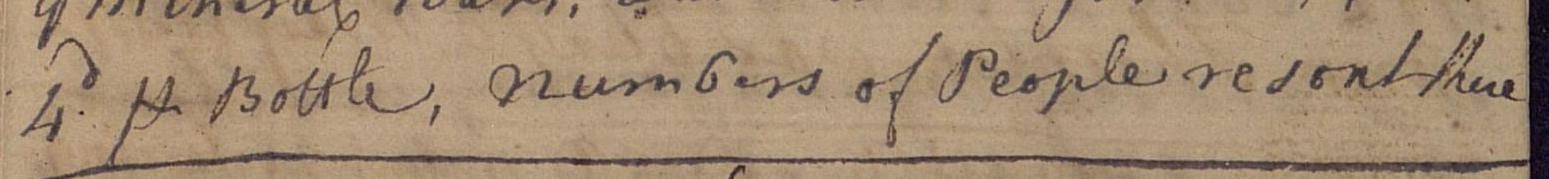4^d. per Bottle, numbers of People resort there
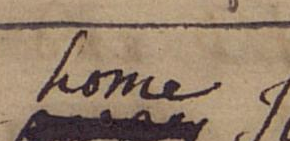home
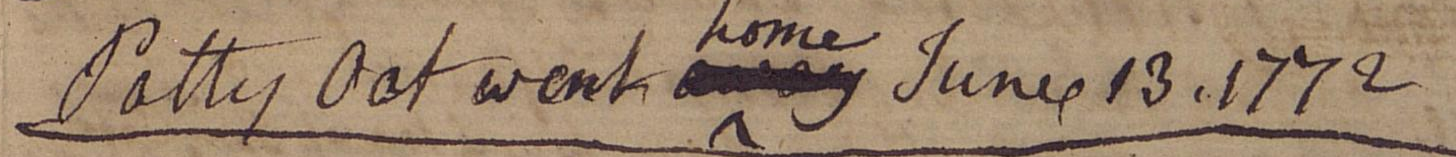Patty Oat went [away] ^ June 13. 1772
